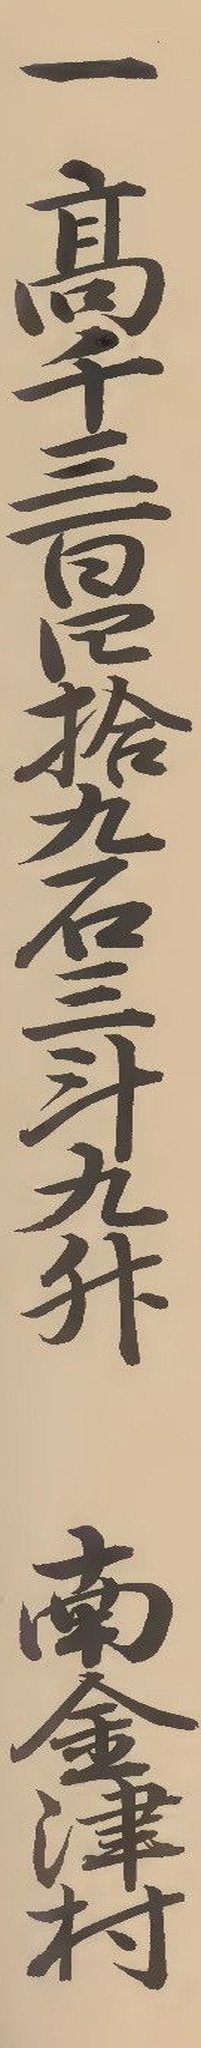一高千三百四拾九石三斗九升南金津村
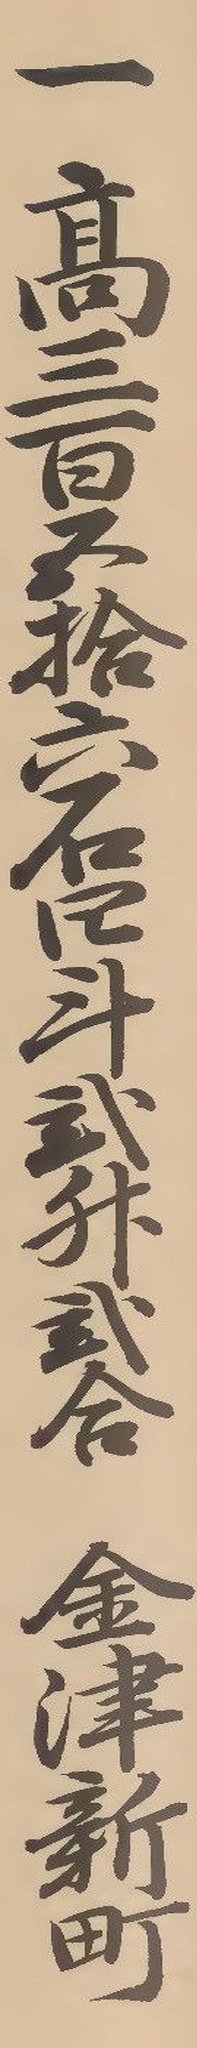一高三百五拾六石四斗弐升弐合金津新町
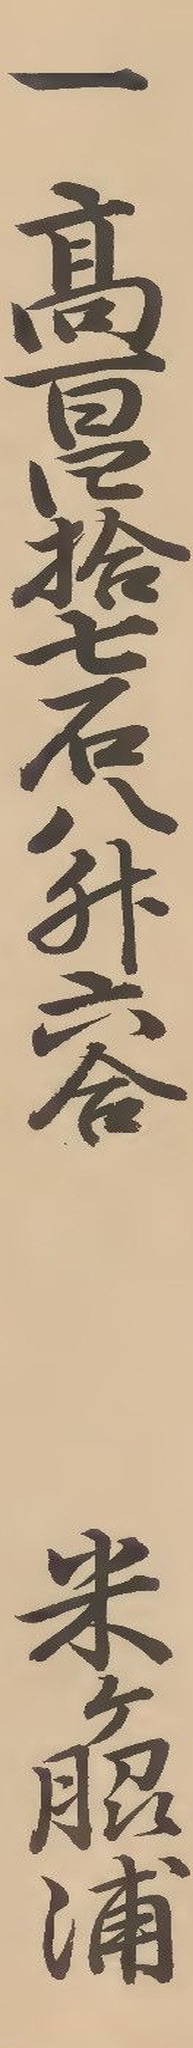一高百四拾七石八升六合米ヶ脇浦
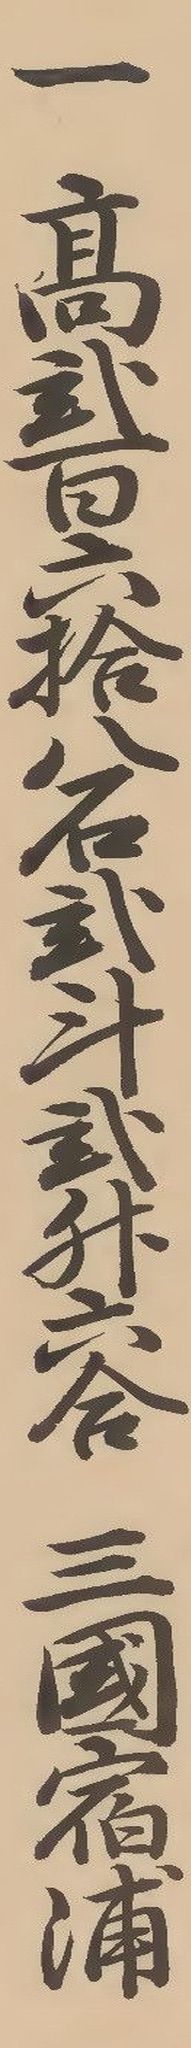一高弐百六拾八石弐斗弐升六合三国宿浦
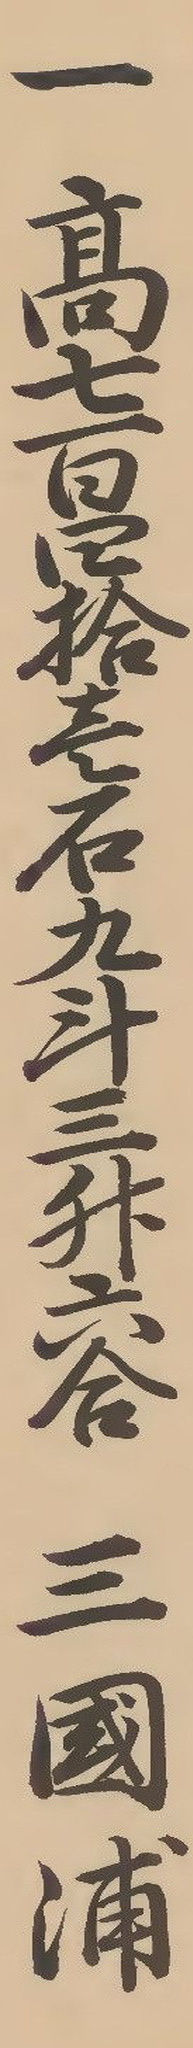一高七百四拾壱石九斗三升六合三国浦

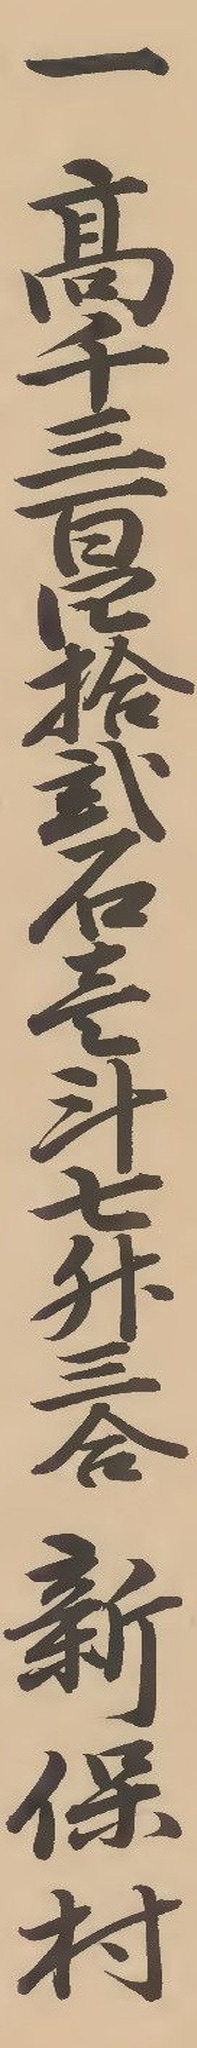一高千三百四拾弐石壱斗七升三合新保村
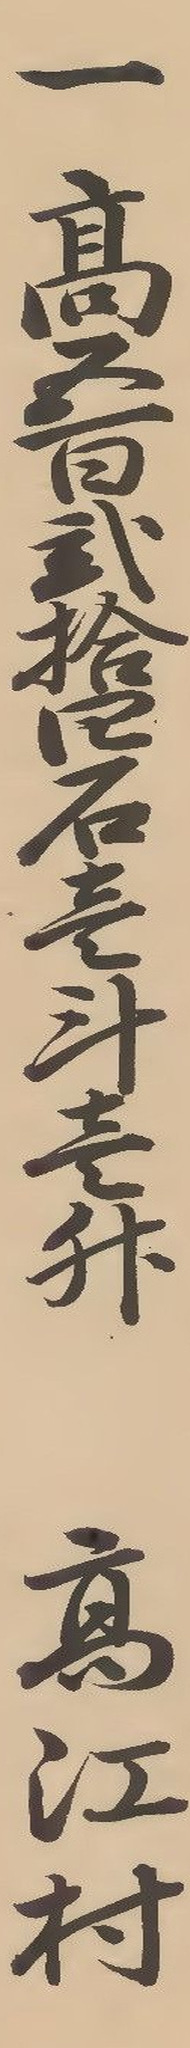一高五百弐拾四石壱斗壱升高江村
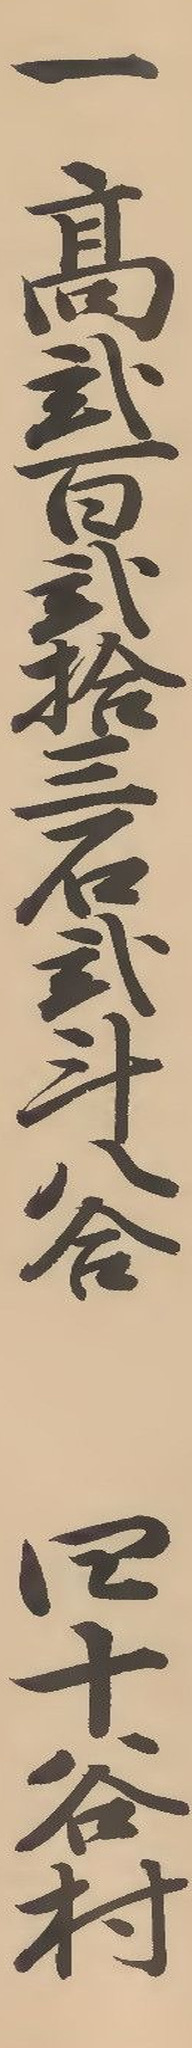一高弐百弐拾三石弐斗八合四十谷村
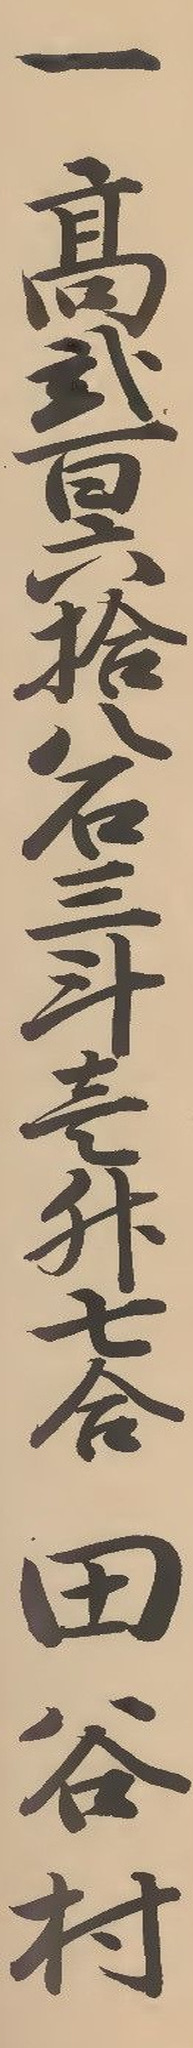一高弐百六拾八石三斗壱升七合田谷村
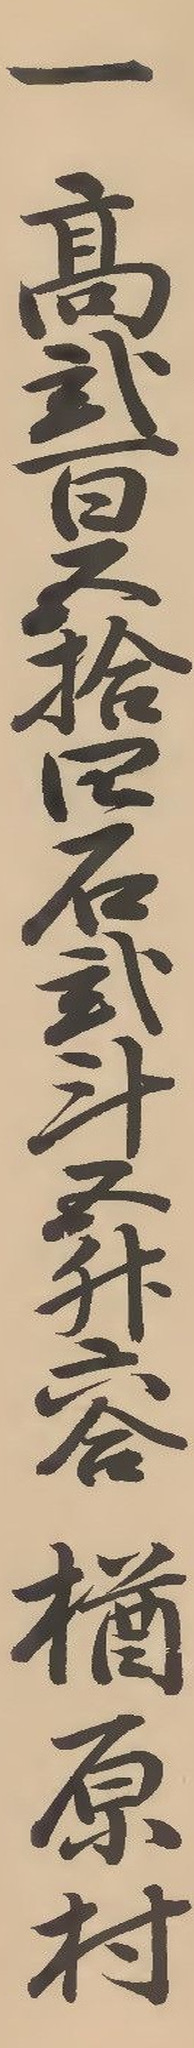一高弐百五拾四石弐斗五升六合楢原村
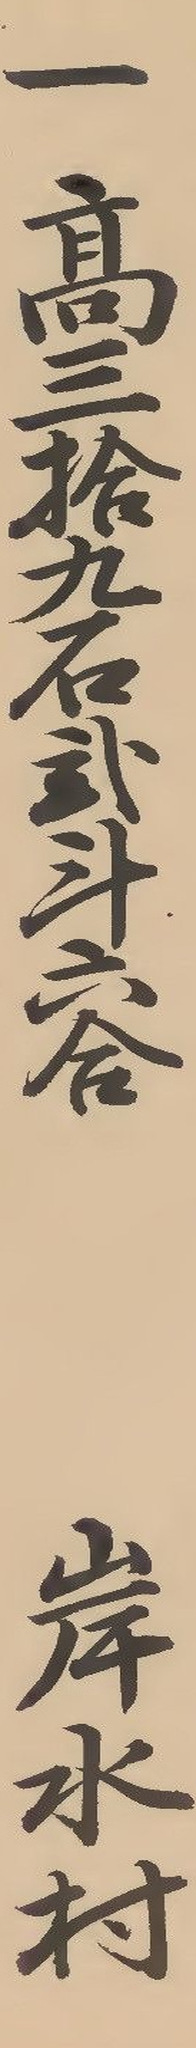一高三拾九石弐斗六合岸水村
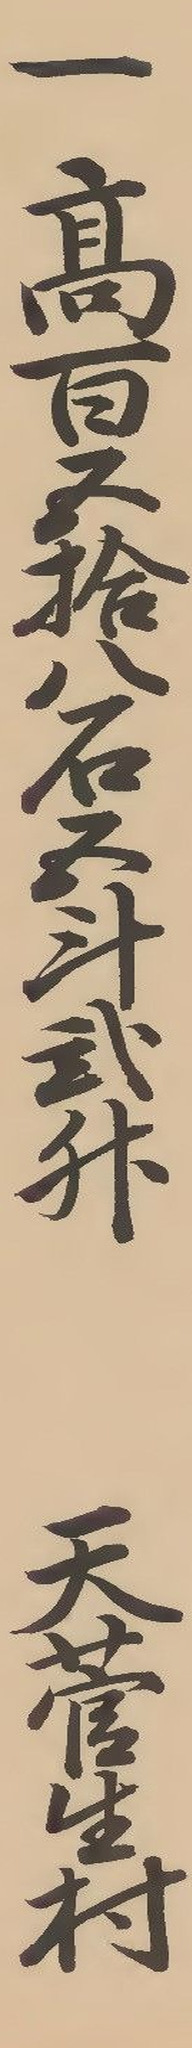一高百五拾八石五斗弐升天菅生村

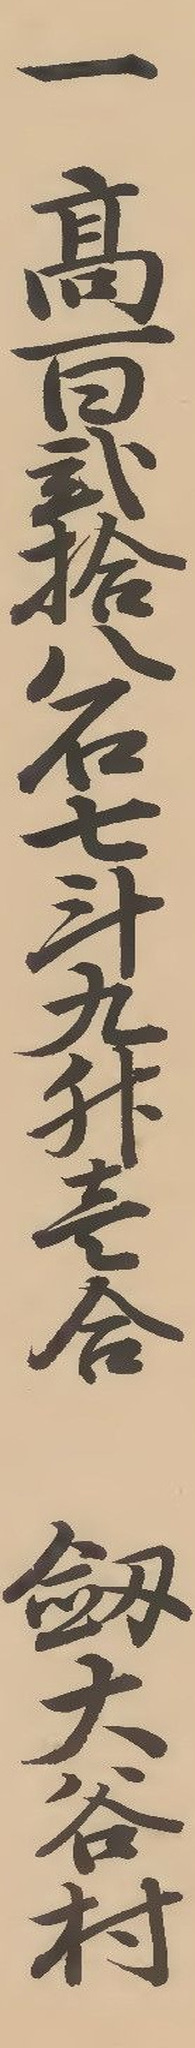一高百弐拾八石七斗九升壱合剣大谷村
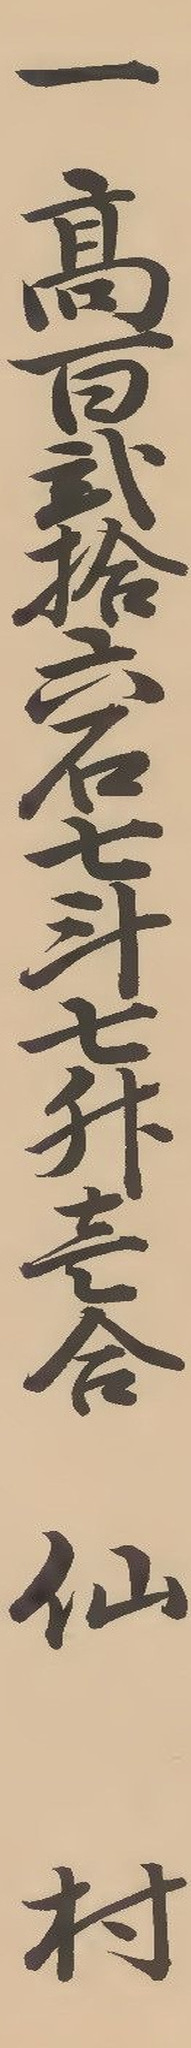一高百弐拾六石七斗七升壱合仙村
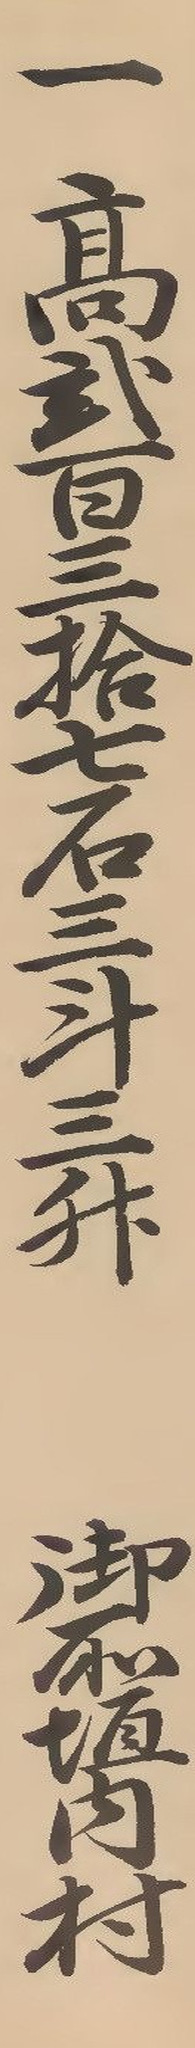一高弐百三拾七石三斗三升御所垣内村
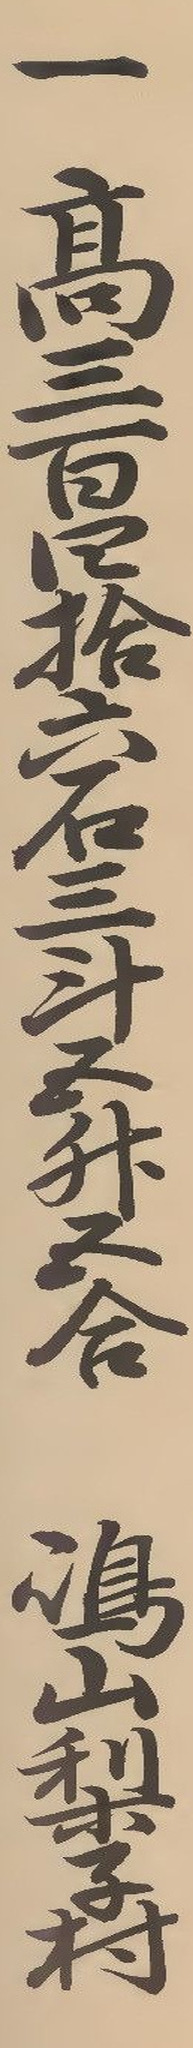一高三百四拾六石三斗五升五合島山梨子村
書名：越前国郷帳
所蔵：国立公文書館 National Archives of Japan
